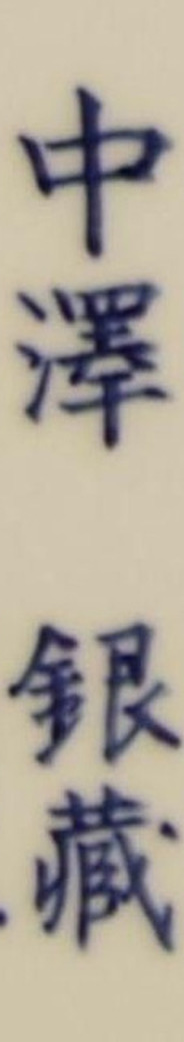中澤銀蔵
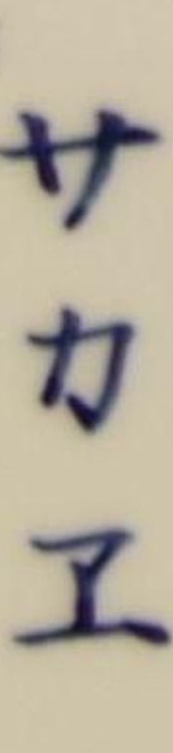サカヱ
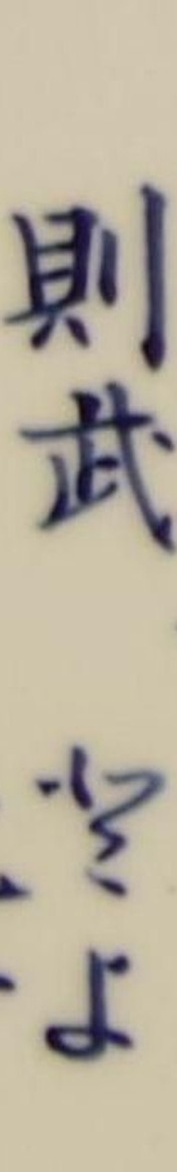則武とよ

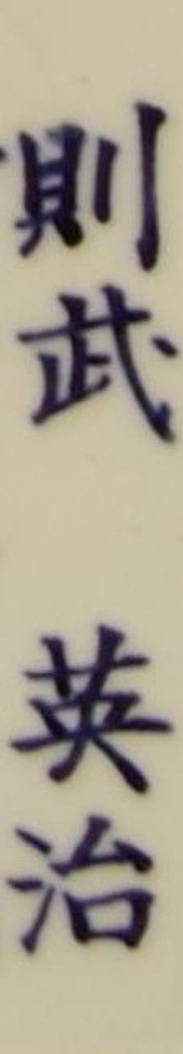則武英治
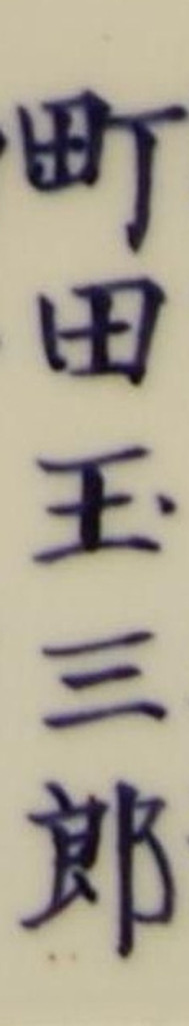町田玉三郎
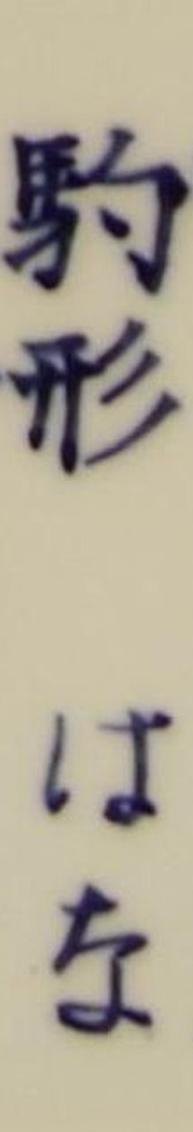駒形はな
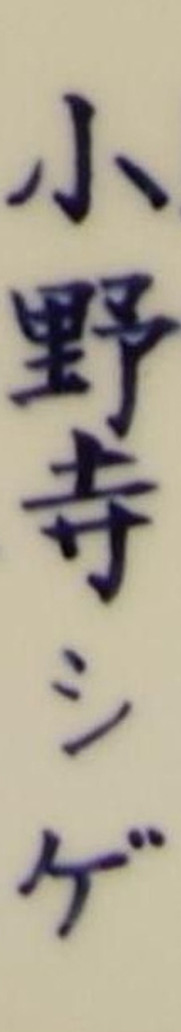小野寺シゲ
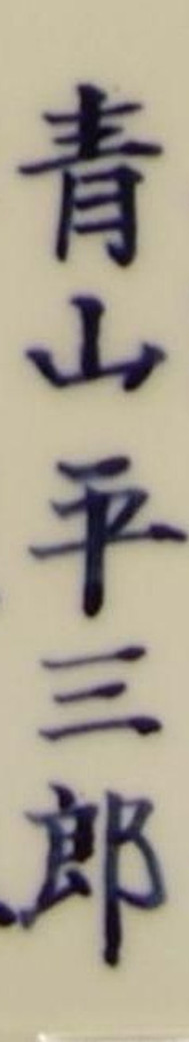青山平三郎
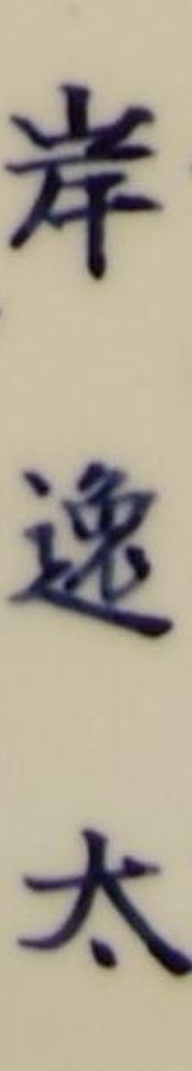岸逸太
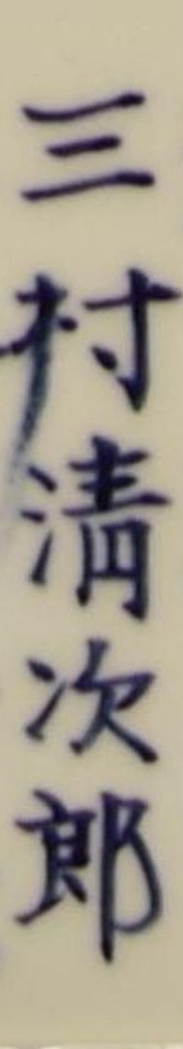三村清次郎
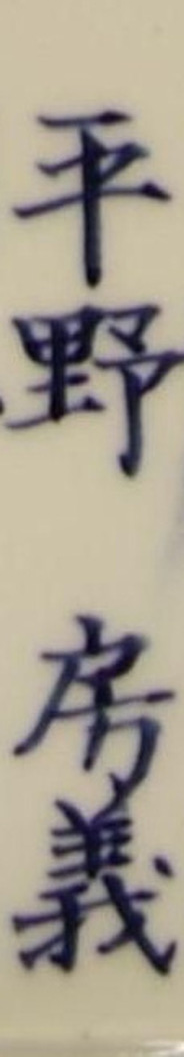平野房義
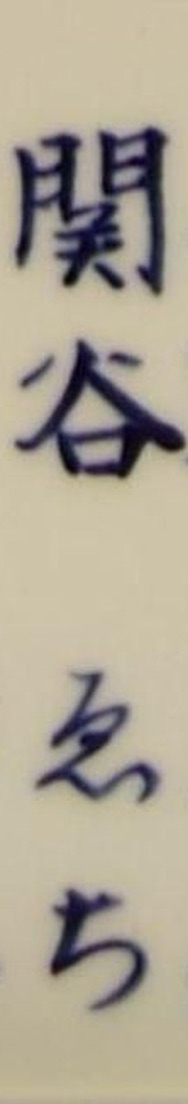関谷ゑち
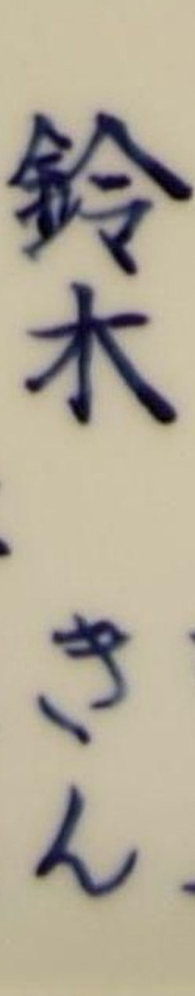鈴木きん
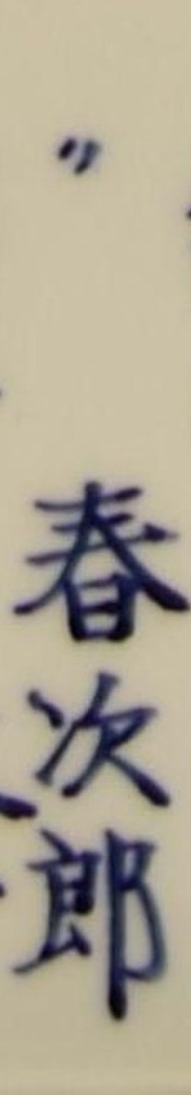春次郎
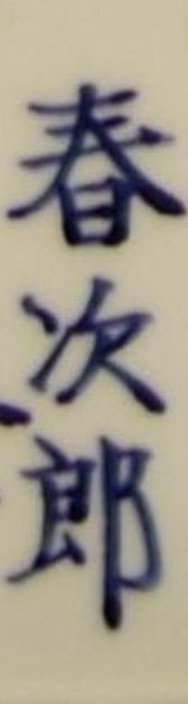春次郎
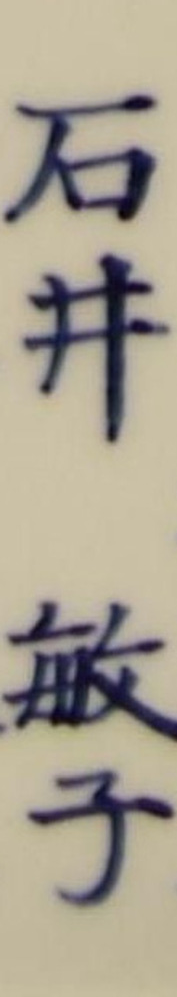石井敏子
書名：A~D
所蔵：koyasan kongobuji
